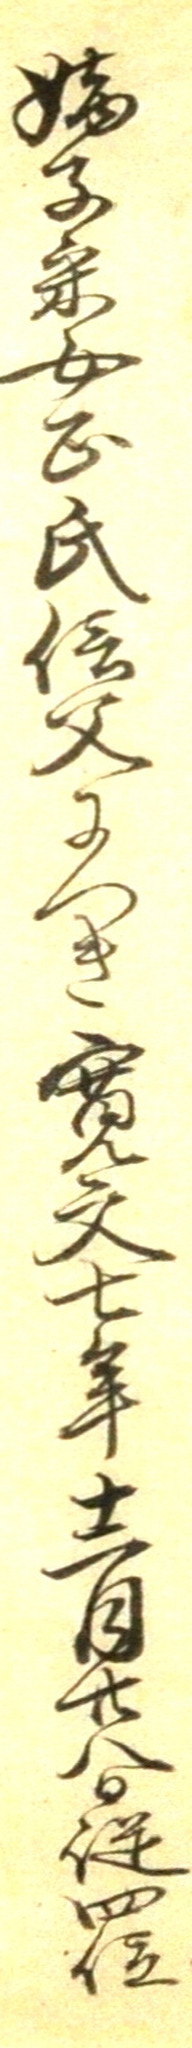嫡子采女正氏信父につき寛文七年十二月廿八日従四位
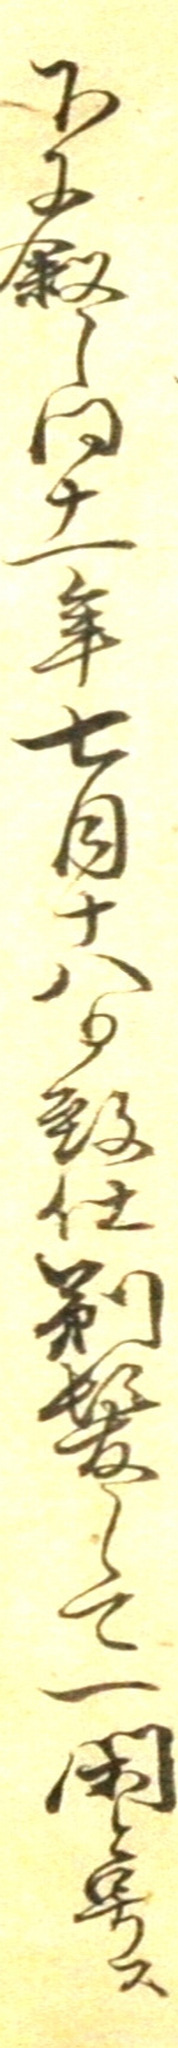下に叙し同十一年七月十八日致仕剃髪して一閑と号ス
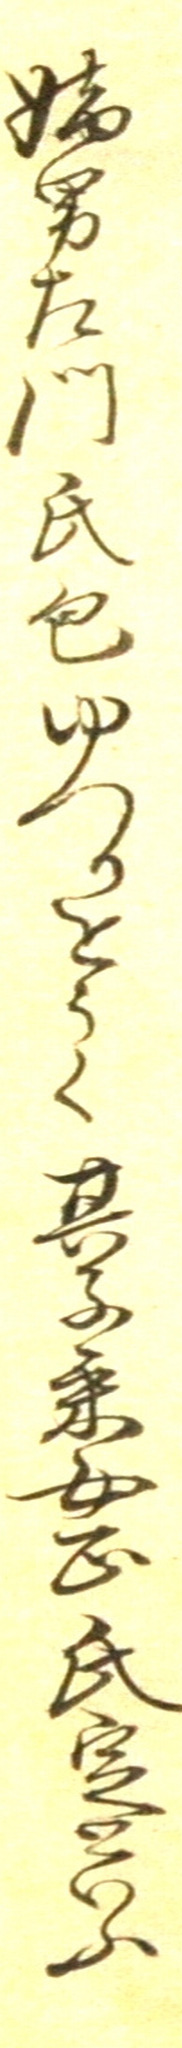嫡男左門氏包ゆつりをうく其子采女正氏定といふ

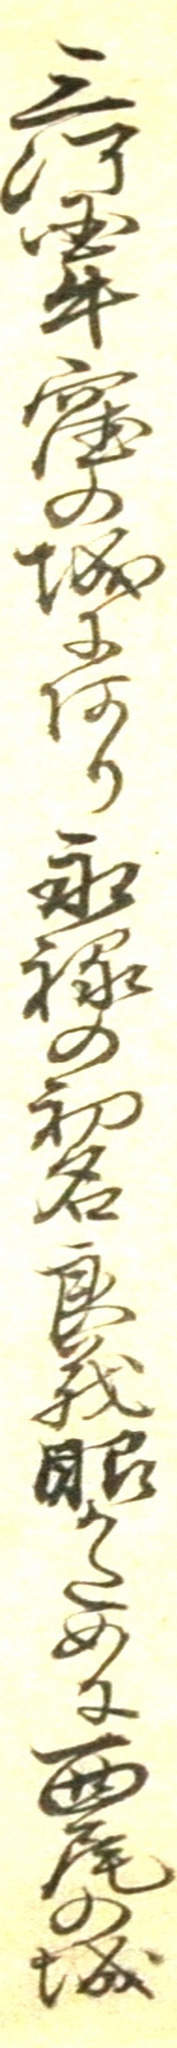三河国牛窪の城にあり永禄の初名良我眼かために西尾の城
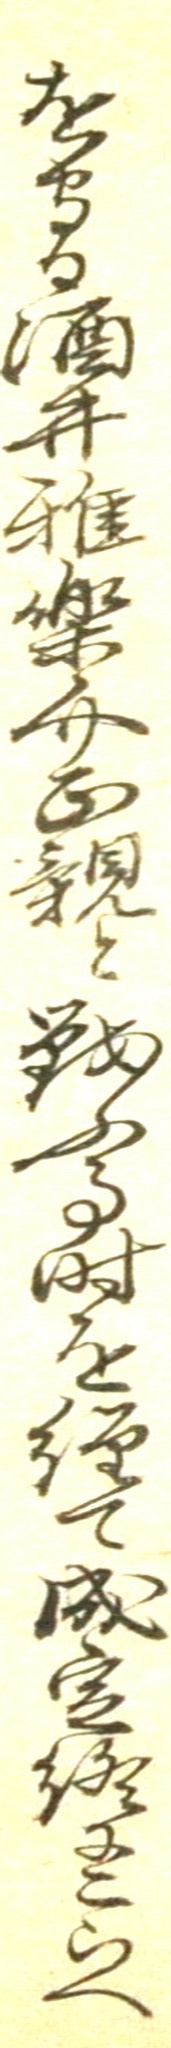を守る酒井雅楽介正親と戦ふ事時を経て成定終にこらへ
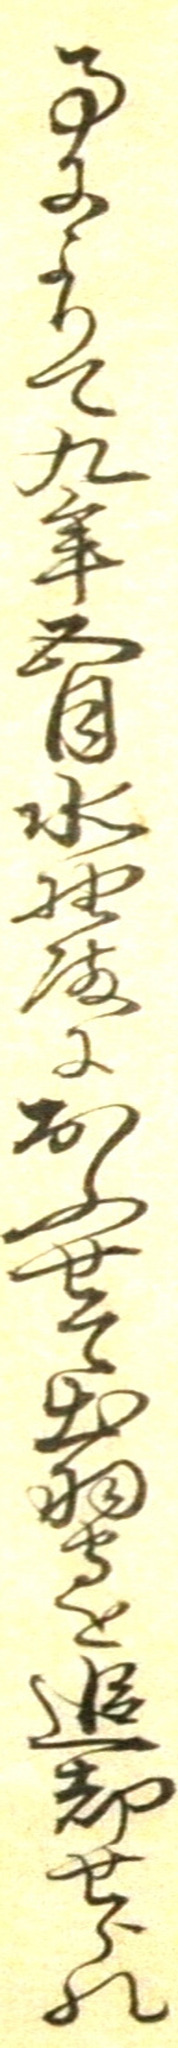事によりて九年五月水野殿におふせて出羽守を追却せられ
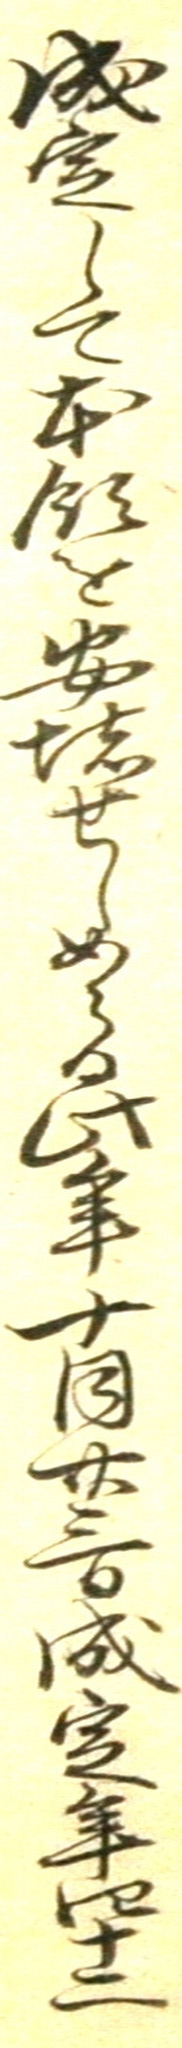成定して本領を安堵せしめらる此年十月廿三日成定年四十二
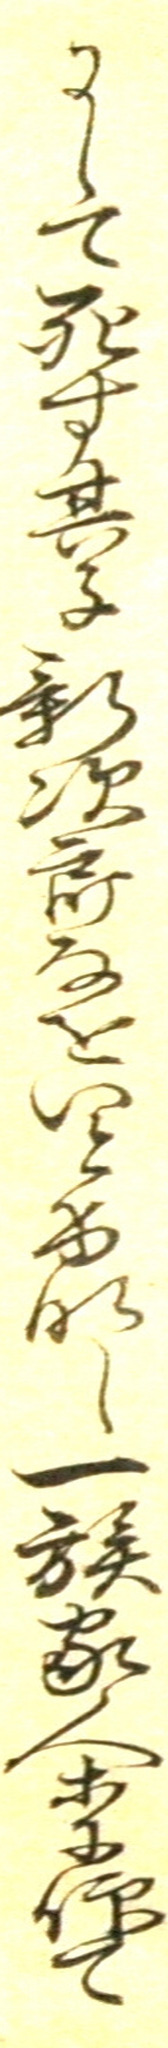にして死す其子新次郎なをいとけなし一族家人等に仰て

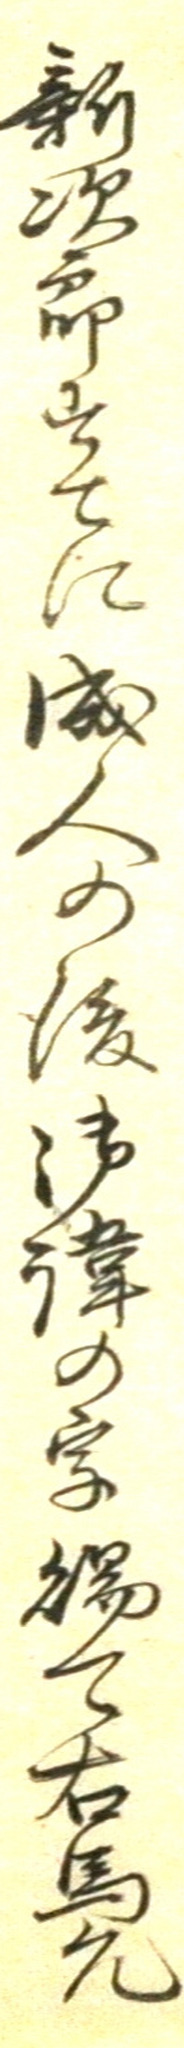新次郎すてに成人の後御諱の字賜て右馬允
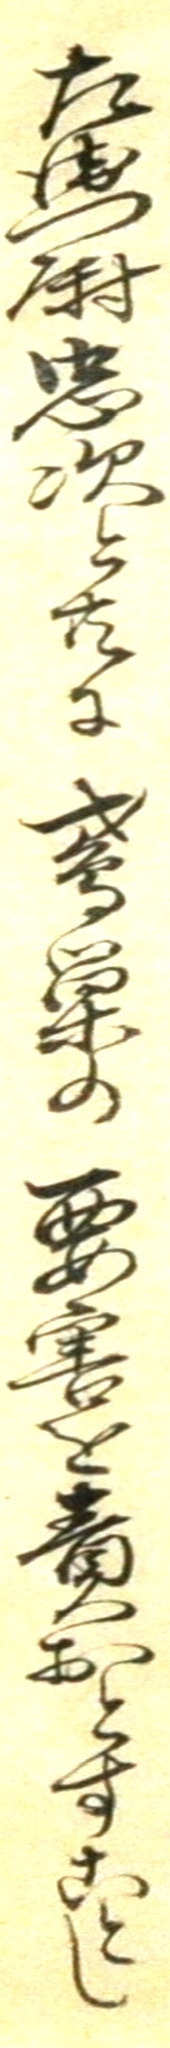左衛門尉忠次と共に鳶巣の要害を責おとすことし
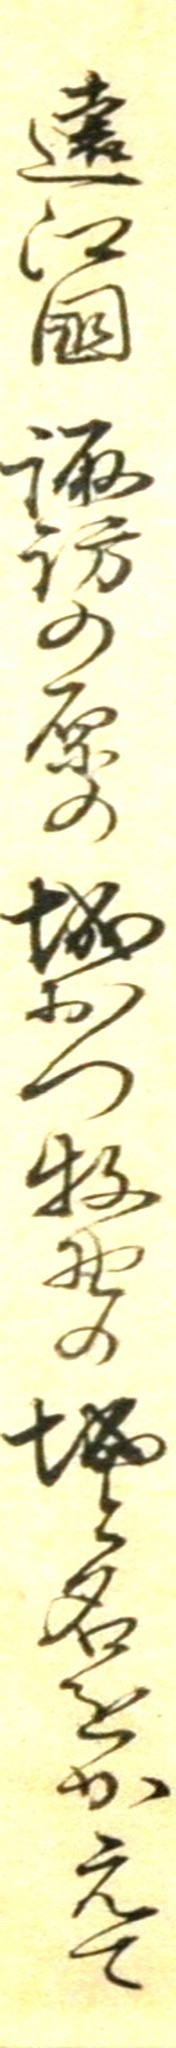遠江国諏訪の原の城おつ牧野の城と名をかえて

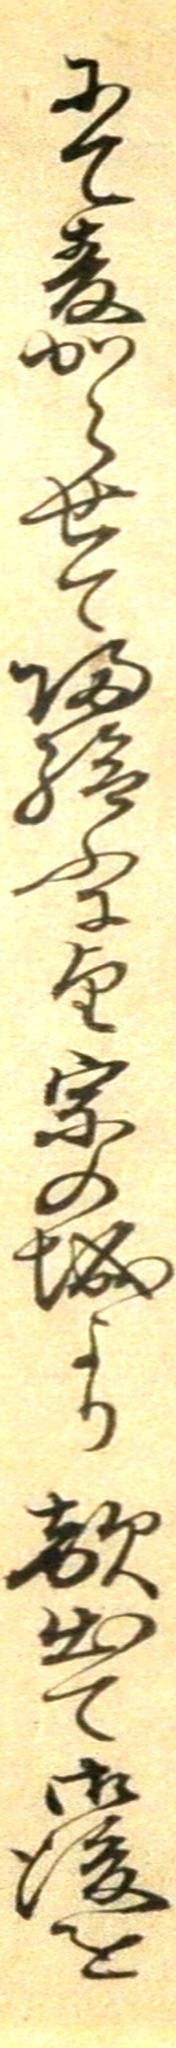にて麦からせて備給ふに望宗の城より敵出て御後を
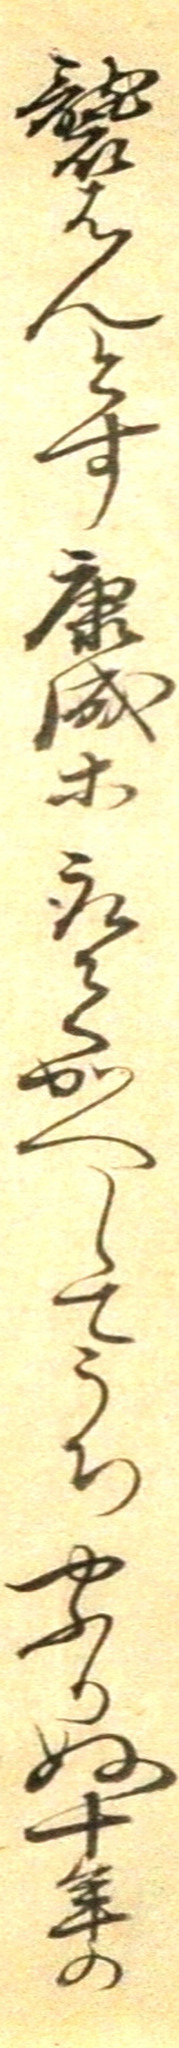襲はんとす康成等取てかへしてうちやふりぬ十年の
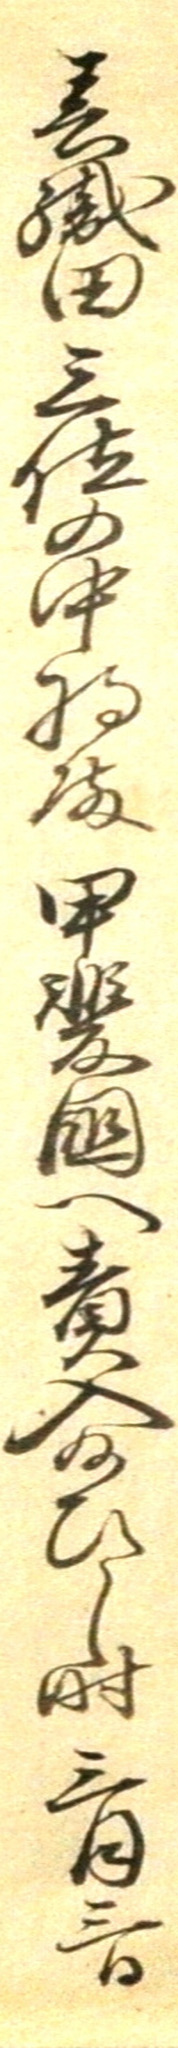春織田三位の中将殿甲斐国へ責入給ひし時三月三日
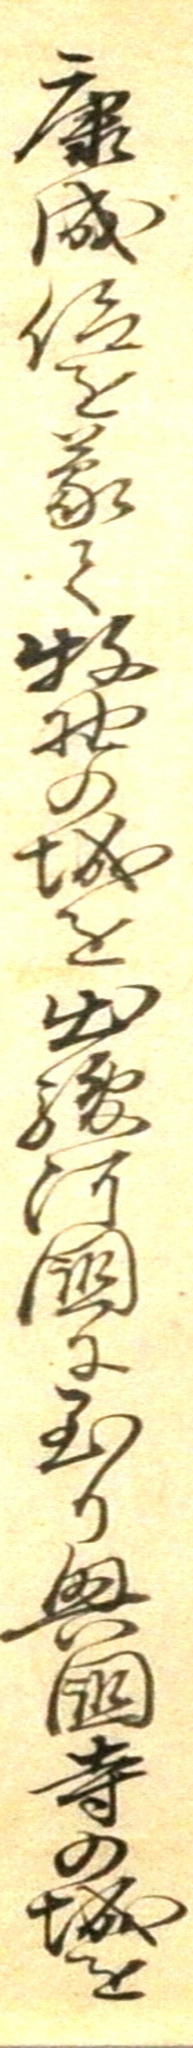康成仰を蒙て牧野の城を出駿河国に至り興国寺の城を
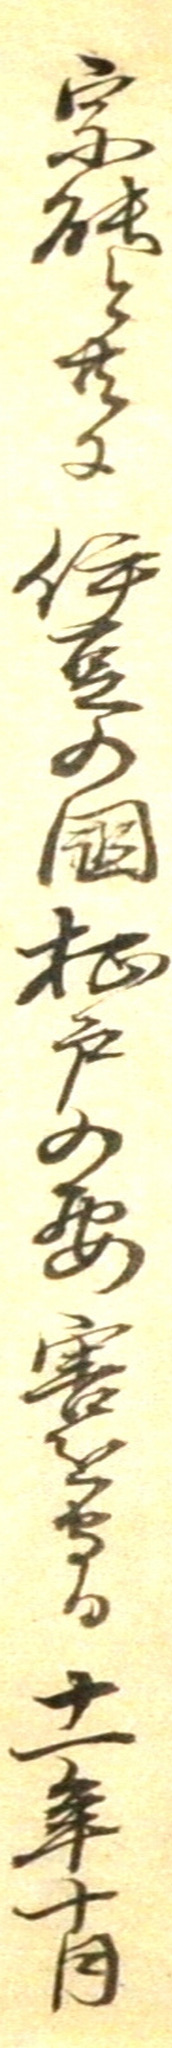宗能と共に伊豆の国柾戸の要害を守る十一年十月
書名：藩翰譜（四・下）
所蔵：伊那市立高遠町図書館・合同会社AMANE
